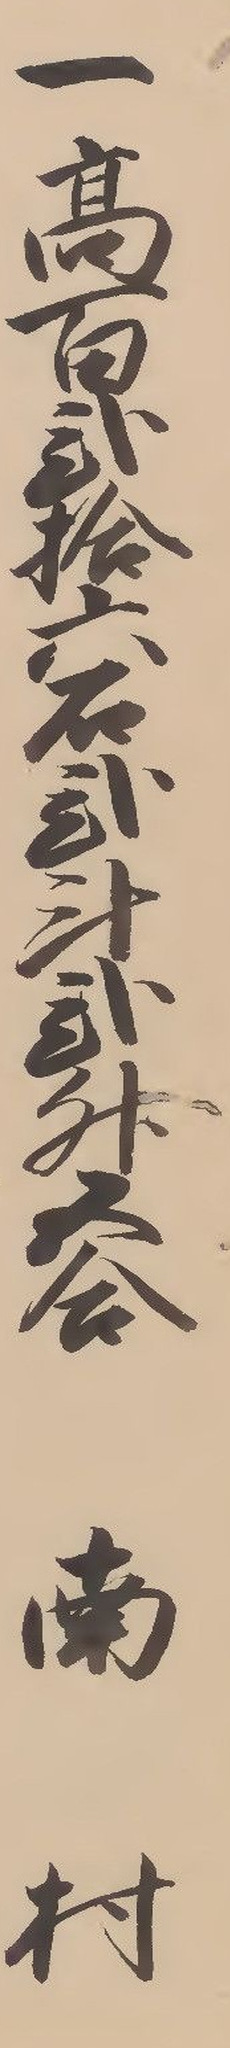一高百弐拾六石弐斗弐升五合南村
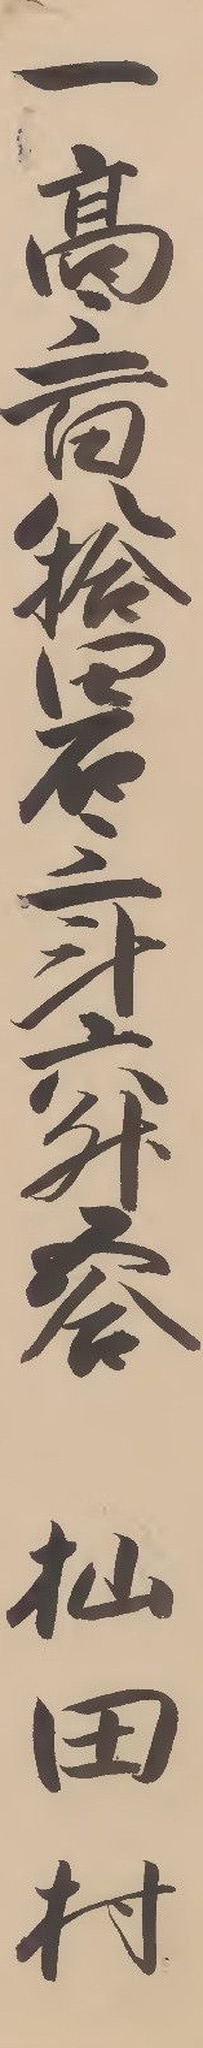一高三百八拾四石三斗六升五合杣田村
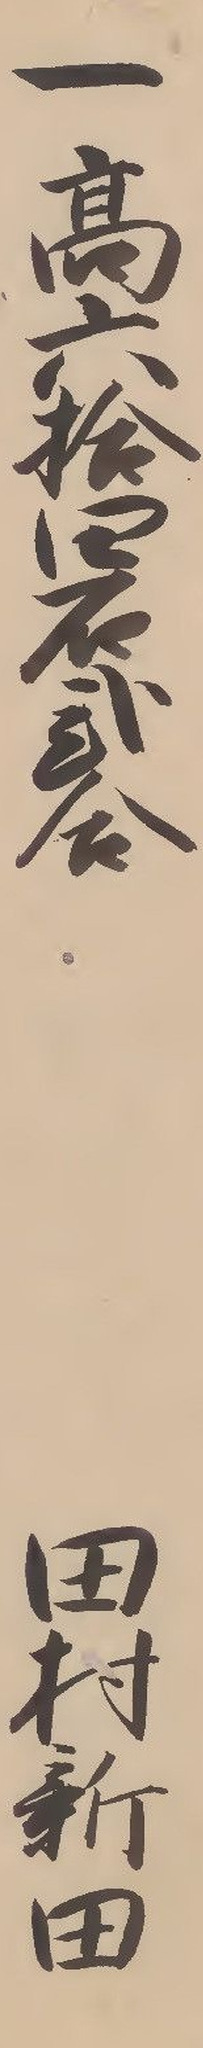一高六拾四石弐合田村新田
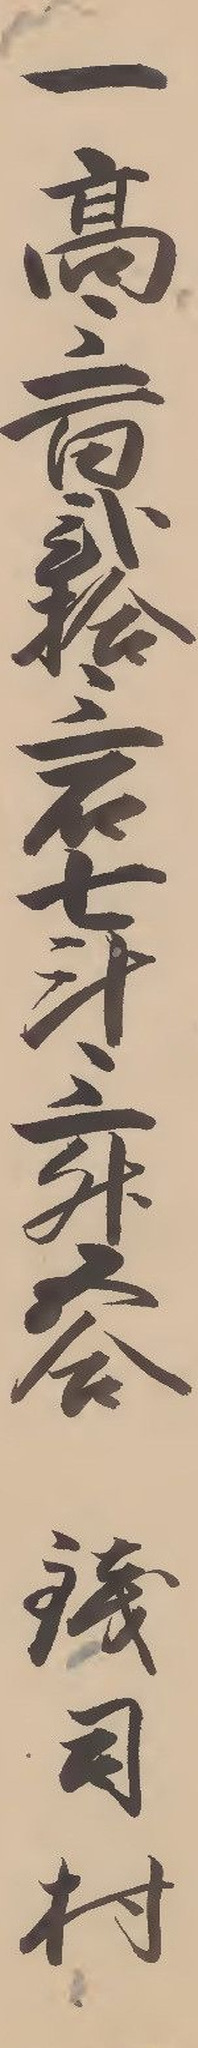一高三百弐拾三石七斗三升五合銭司村
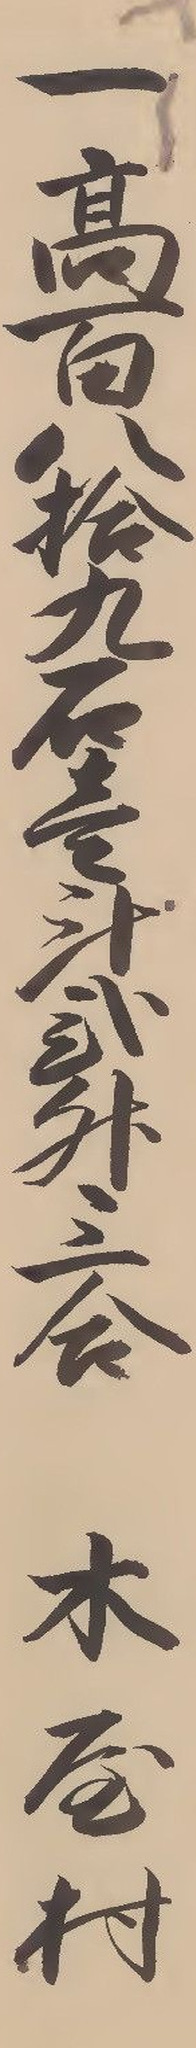一高百八拾九石壱斗弐升三合木屋村
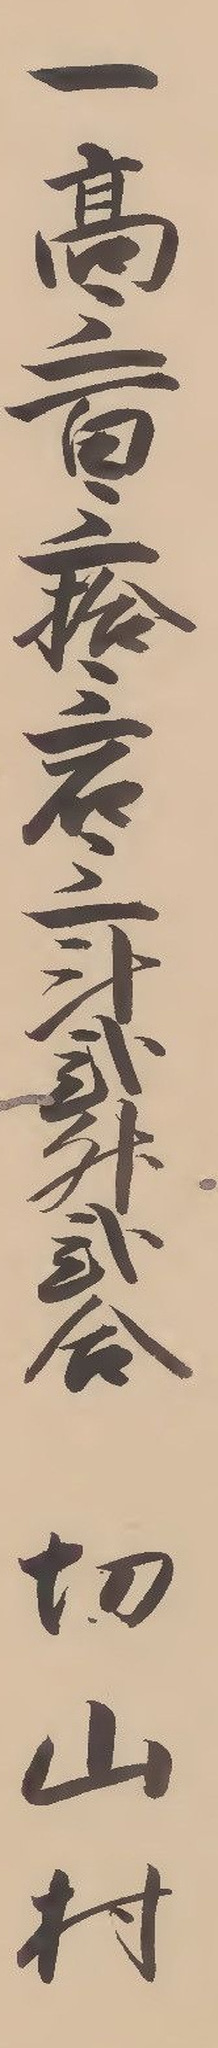一高三百三拾三石三斗弐升弐合切山村

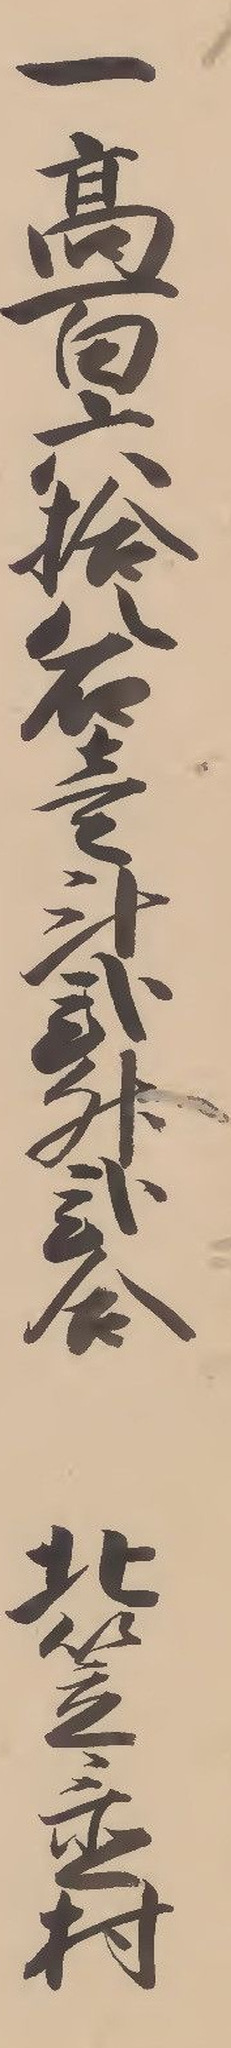一高百六拾八石壱斗弐升弐合北笠置村
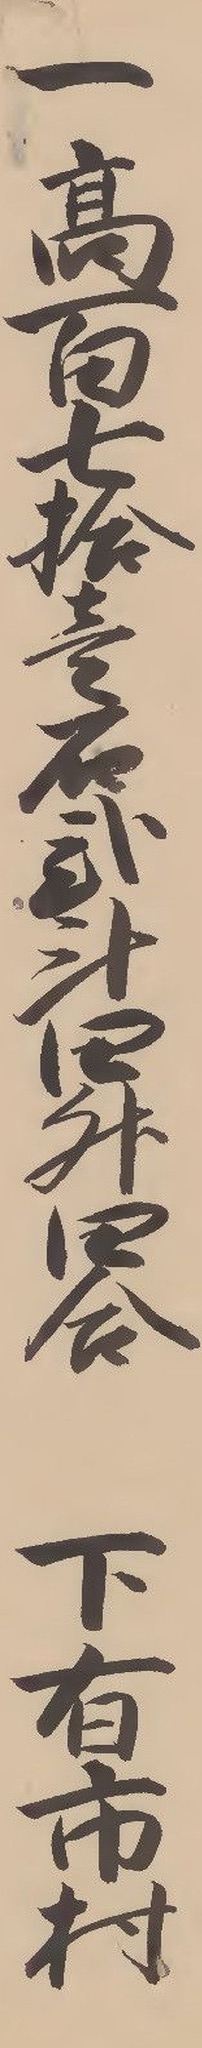一高百七拾壱石弐斗四升四合下有市村
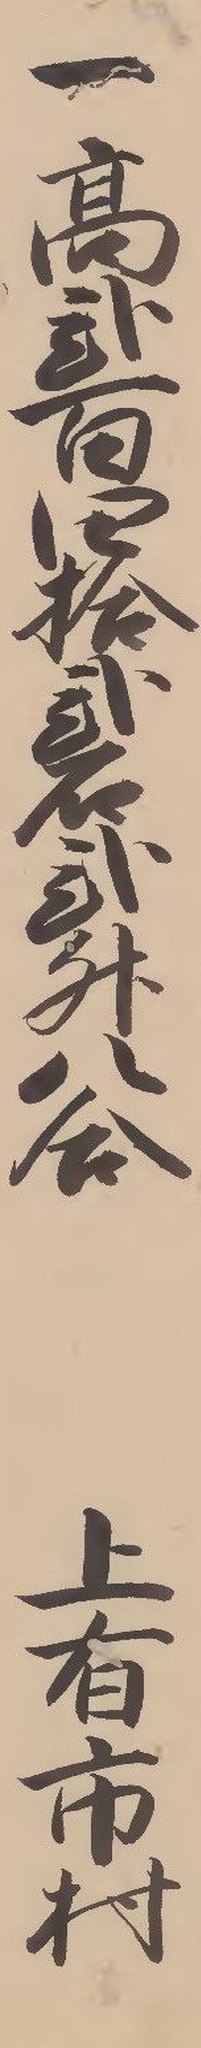一高弐百四拾弐石弐升八合上有市村
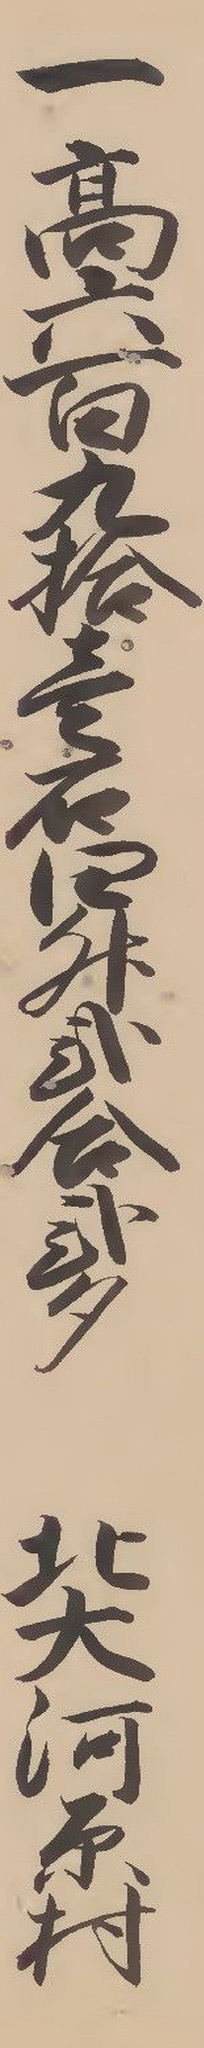一高六百九拾壱石四升弐合弐勺北大河原村
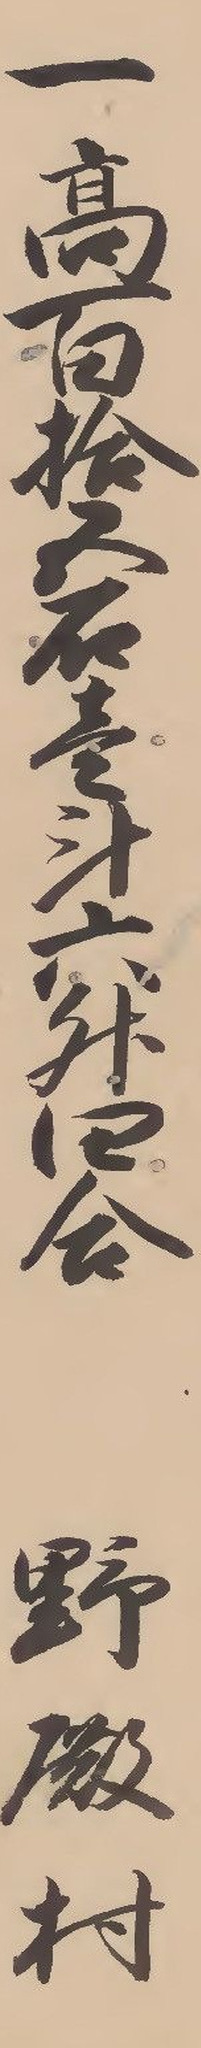一高百拾五石壱斗六升四合野殿村
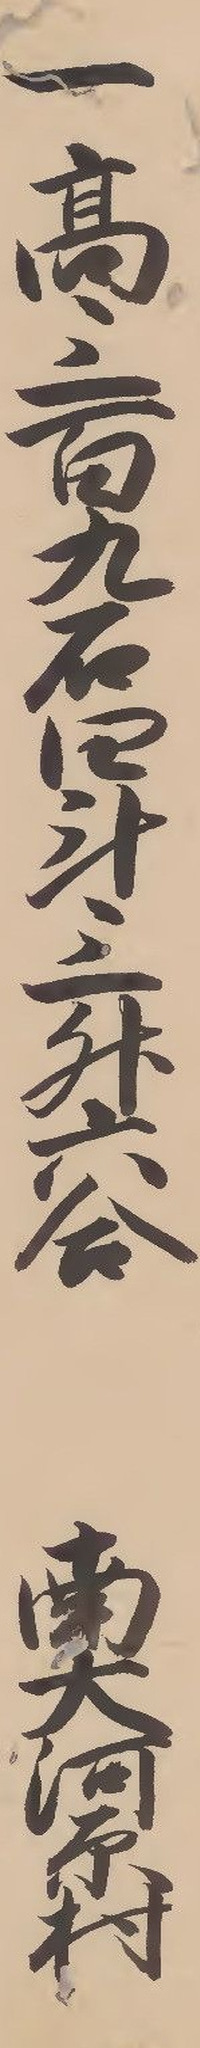一高三百九石四斗三升六合南大河原村
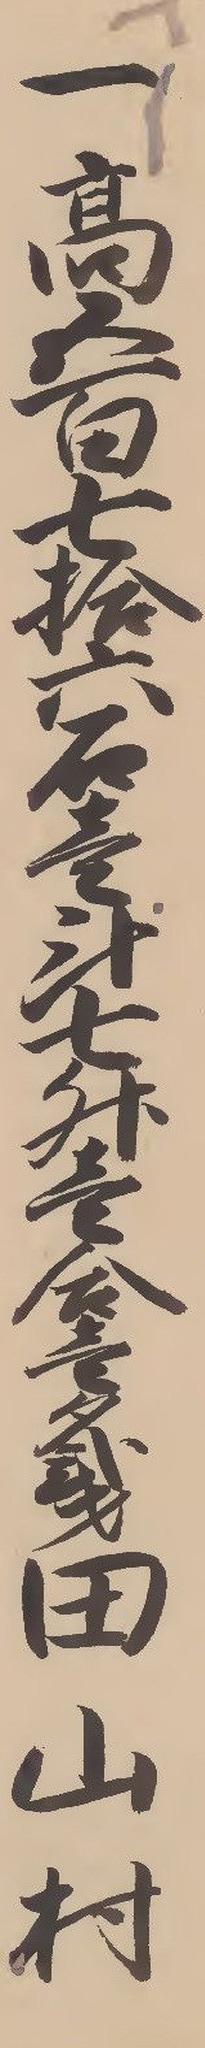一高五百七拾六石壱斗七升壱合壱勺弐才田山村
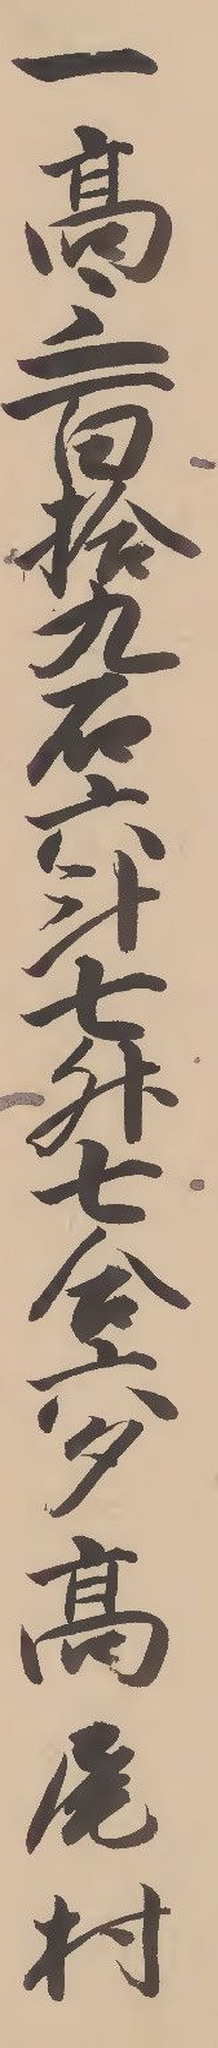一高三百拾九石六斗七升七合六勺高尾村

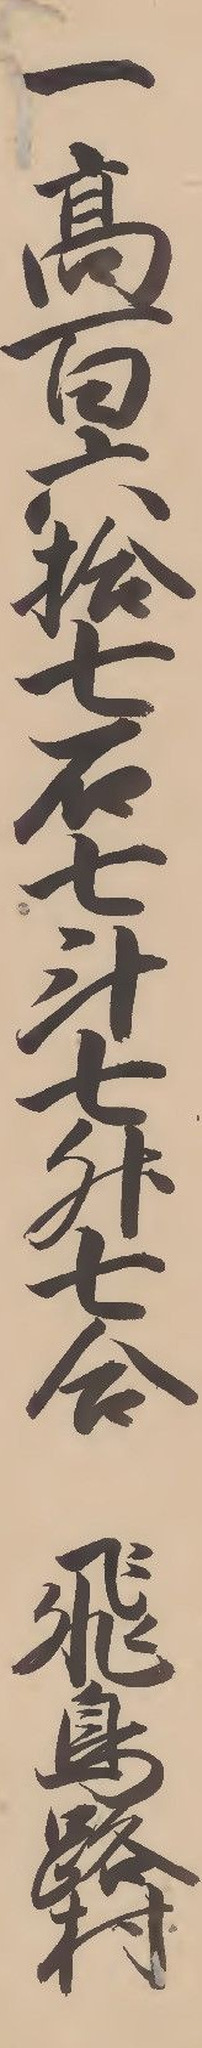一高百六拾七石七斗七升七合飛鳥路村
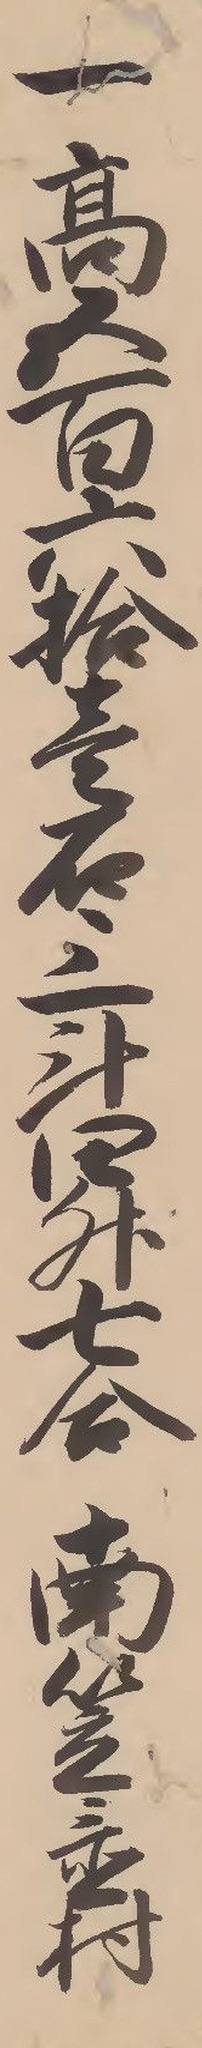一高五百六拾壱石三斗四升七合南笠置村
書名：山城国郷帳
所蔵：国立公文書館 National Archives of Japan
